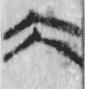大
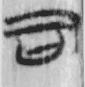司
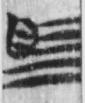馬
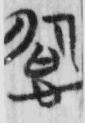○（悼）
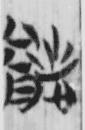○（滑）
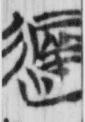𬨭（將）
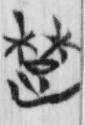楚
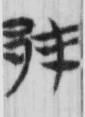邦
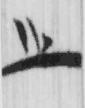之
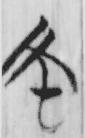帀（師）
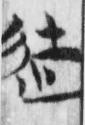徒
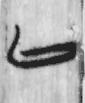㠯（以）
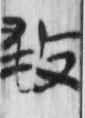○（救）
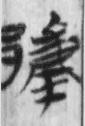郙
